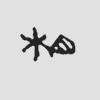相
